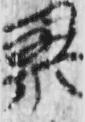○（盟）
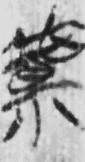○（詛）
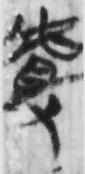且
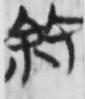叙
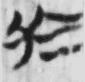於
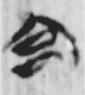宮
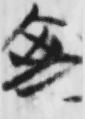室
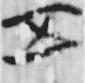五
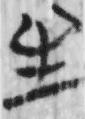生
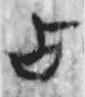占
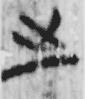之
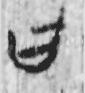曰
